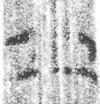立
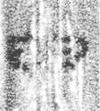日
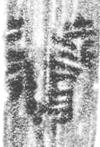贛
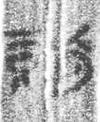賜
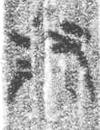布
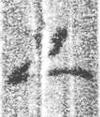也
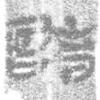請
